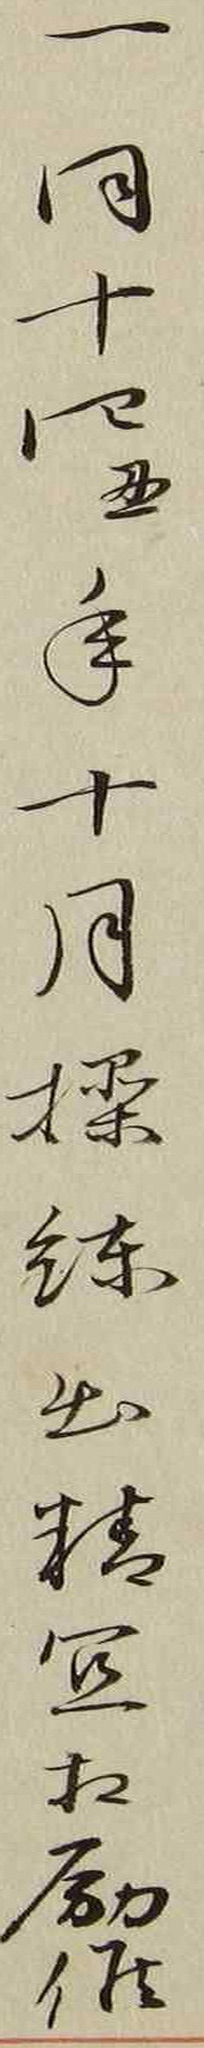一同十四丑年十月操練出精宜相励候
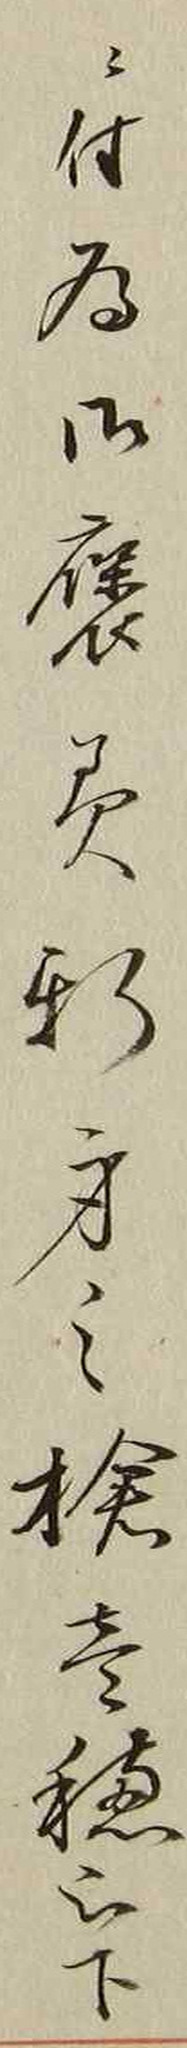ニ付為御褒美新身之槍壱穂被下
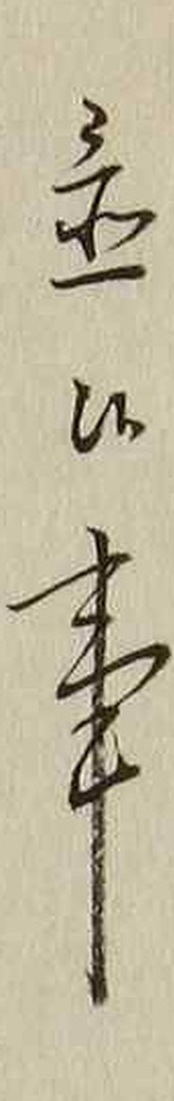置候事
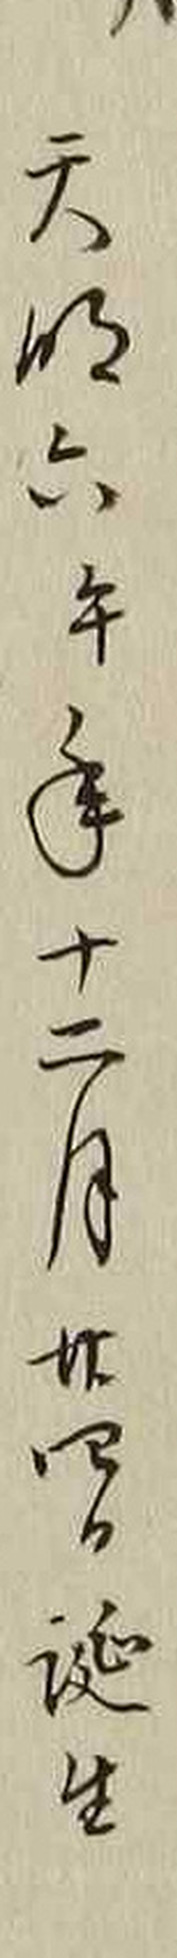天明六午年十二月廿四日誕生
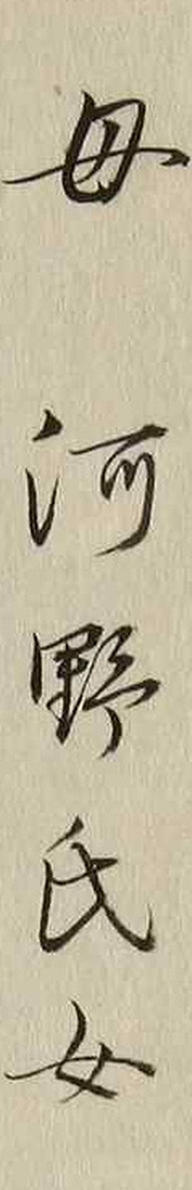母河野氏女
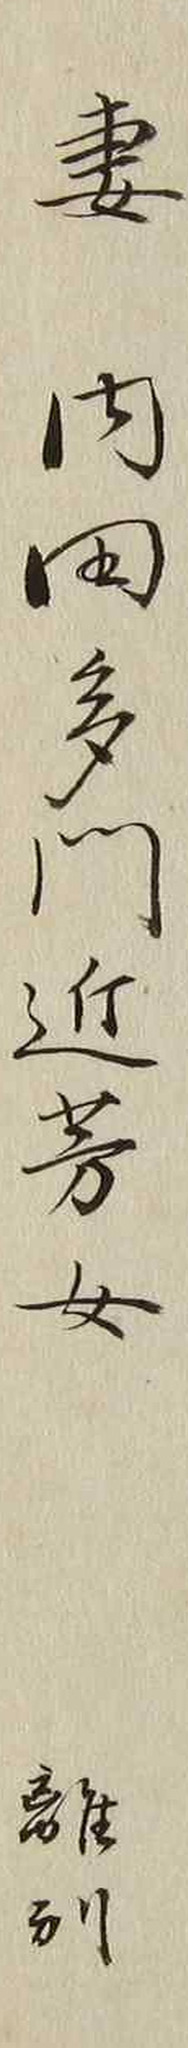妻内田多門近芳女離別
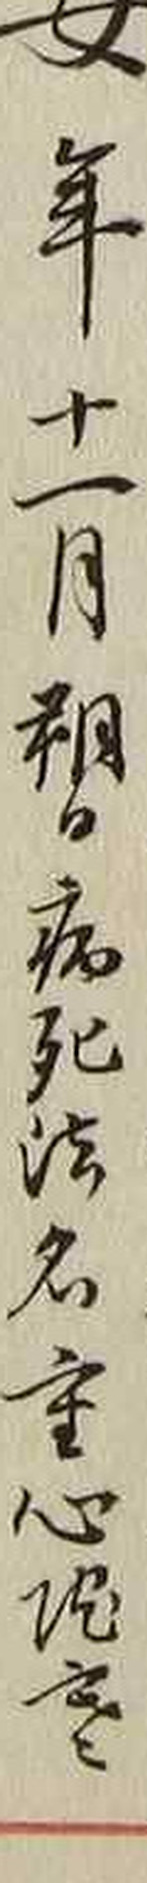年十一月朔日病死法名重心院寒
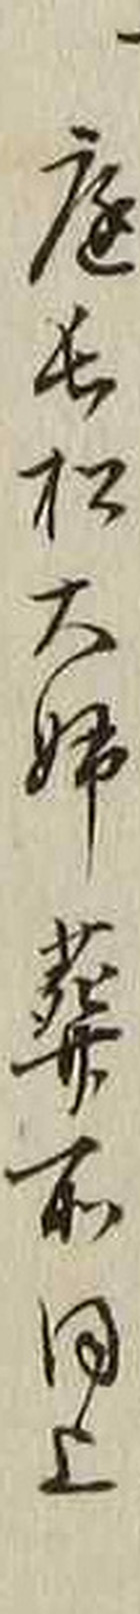庭長松大姉葬所同上
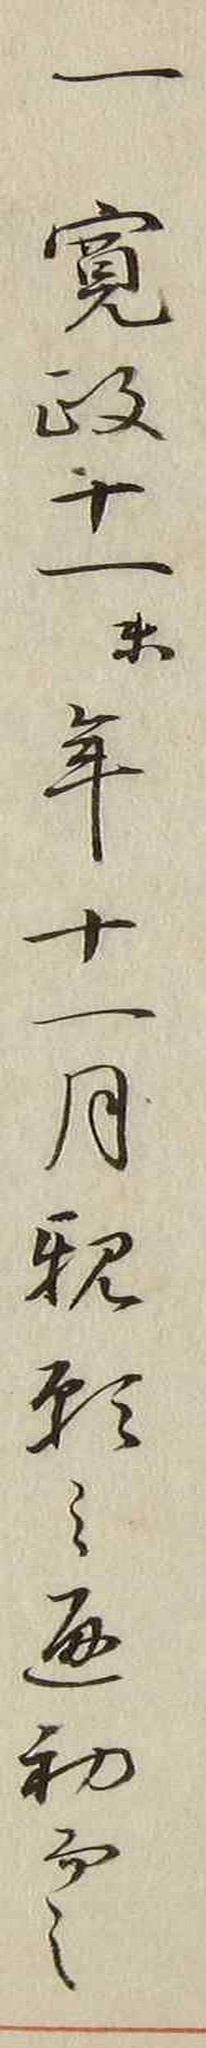一寛政十一未年十一月親願之通初而之
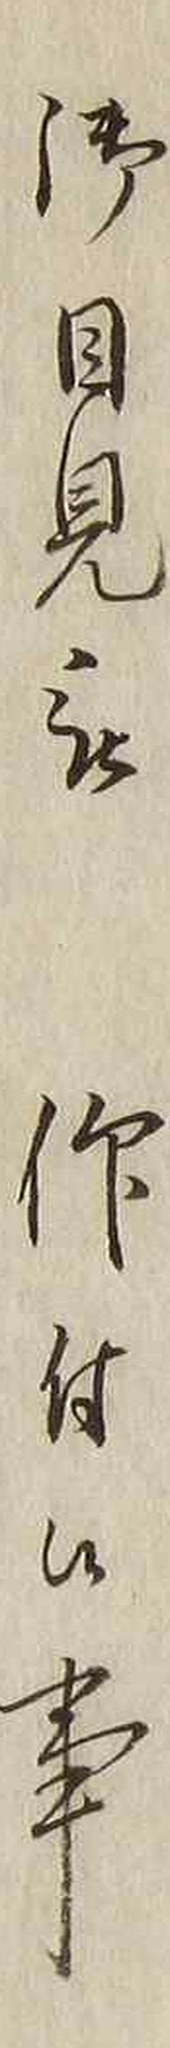御目見被仰付候事
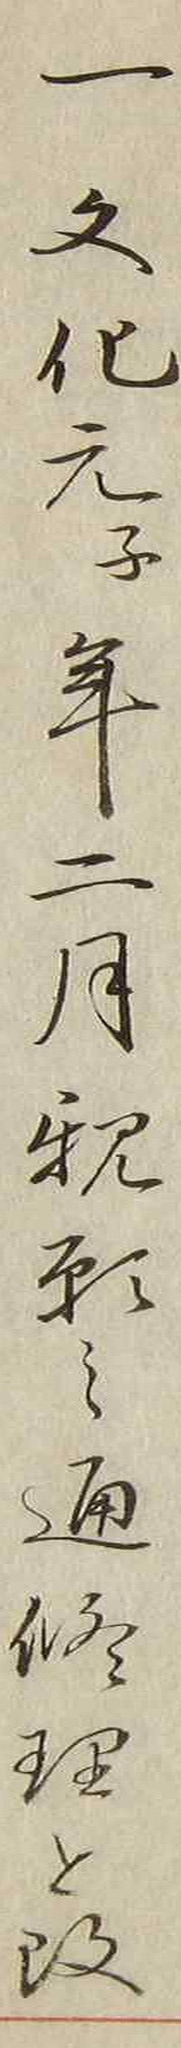一文化元子年二月親願之通修理と改
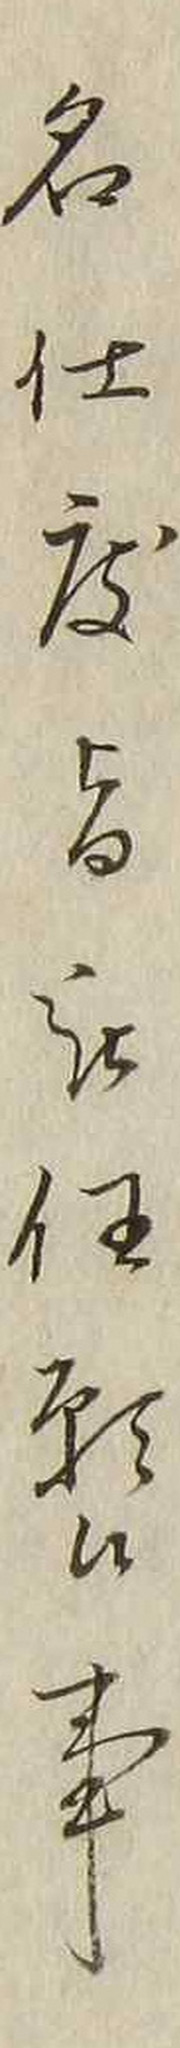名仕度旨被任願候事

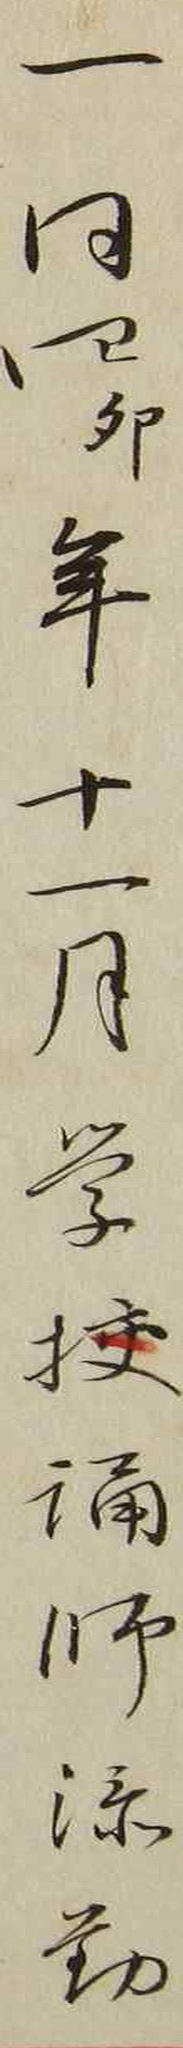一同四卯年十一月学授誦師添勤
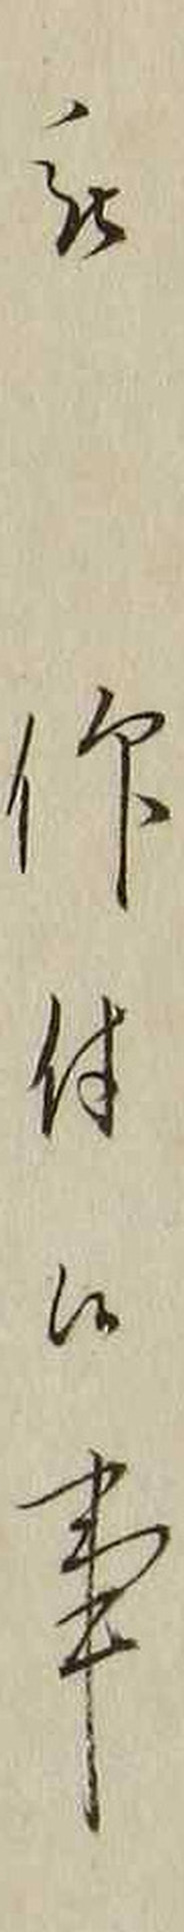被仰付候事
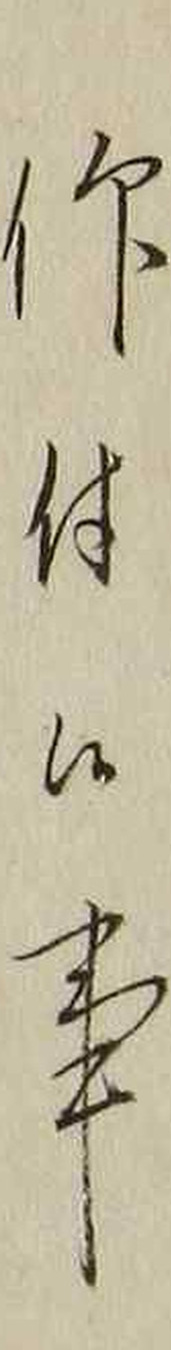仰付候事
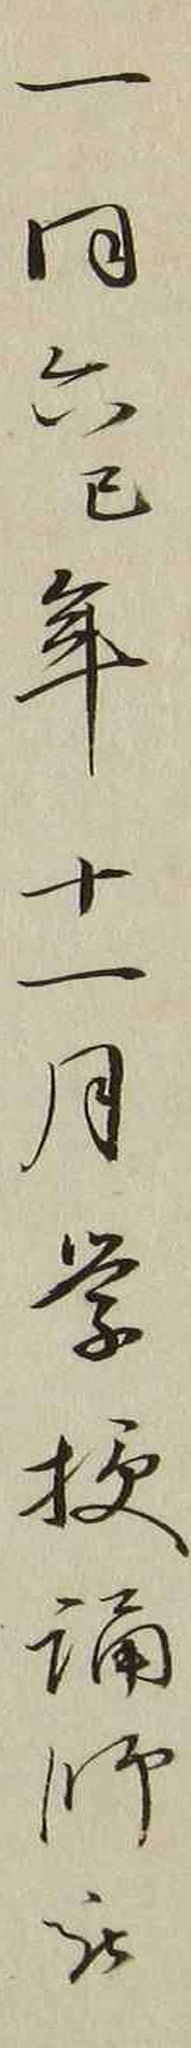一同六巳年十一月学授誦師被
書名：諸士系譜　巻之22　い之部22
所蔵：会津若松市立会津図書館
